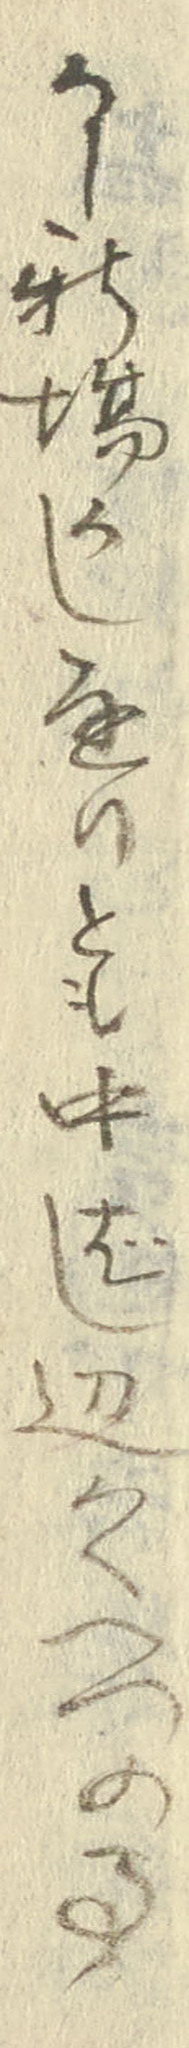かし新場かし通りとも中ばし辺かくへつの事
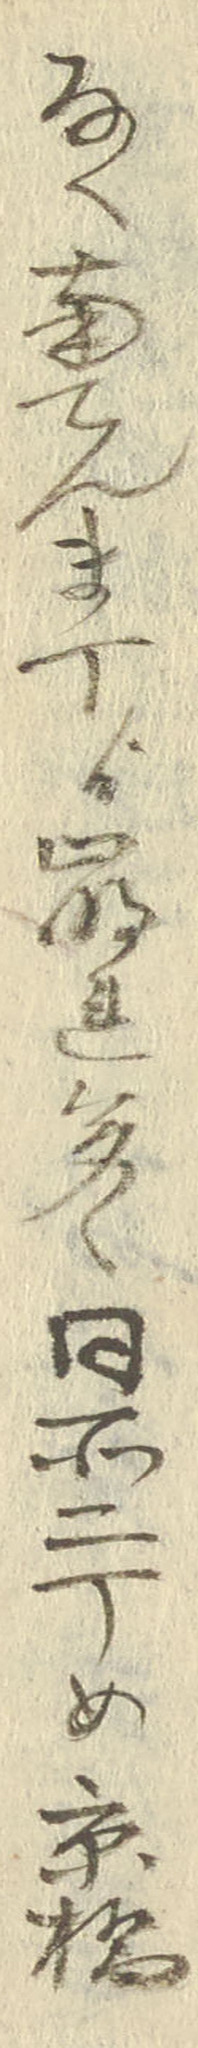なく南てんま丁ゟ崩れ多し同所二丁め京橋
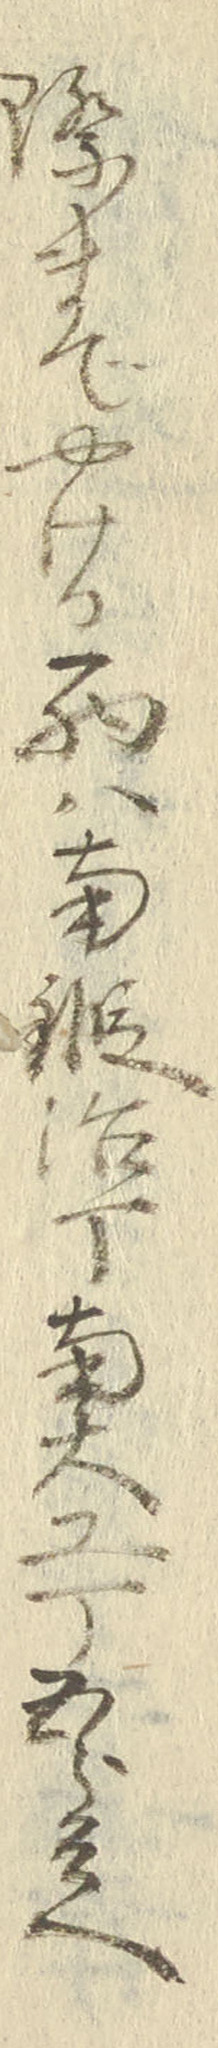際までやける西ハ南鍛冶丁南大工丁五郎兵へ
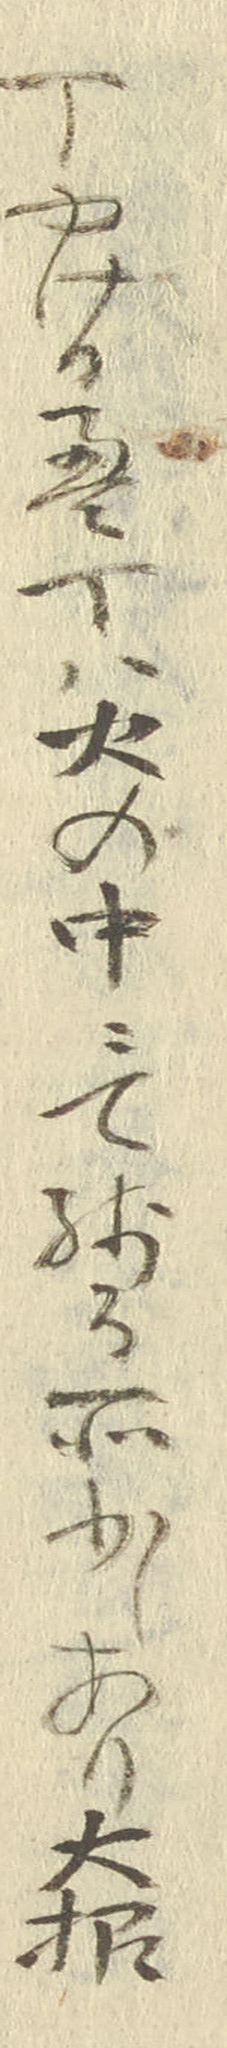丁やける奥丁は火の中ニて残る所少しあり大根
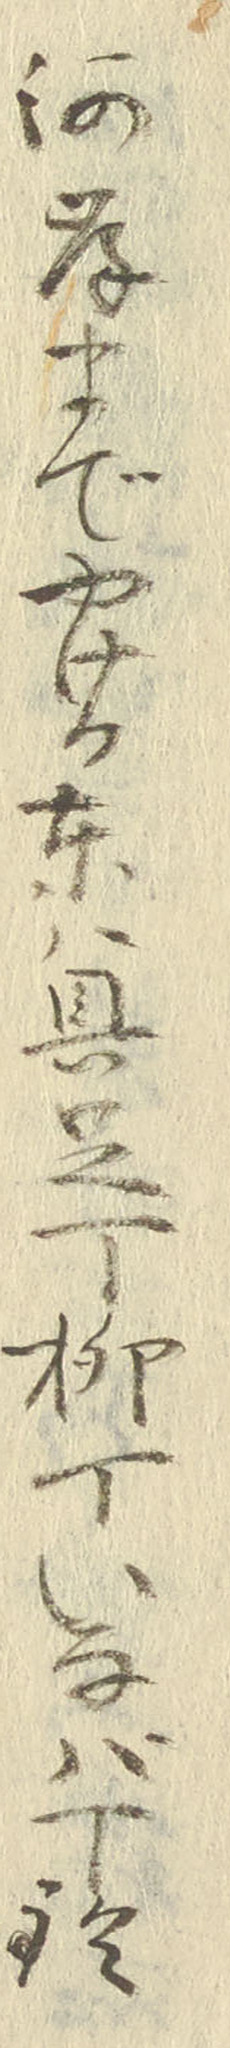河岸までやける東ハ具足丁柳丁いなば丁鈴
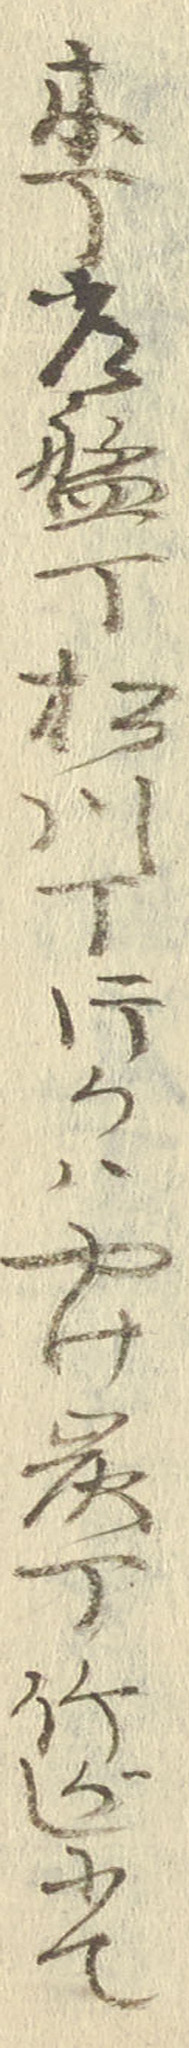木丁常盤丁松川丁片かハやけ炭丁竹がしにて
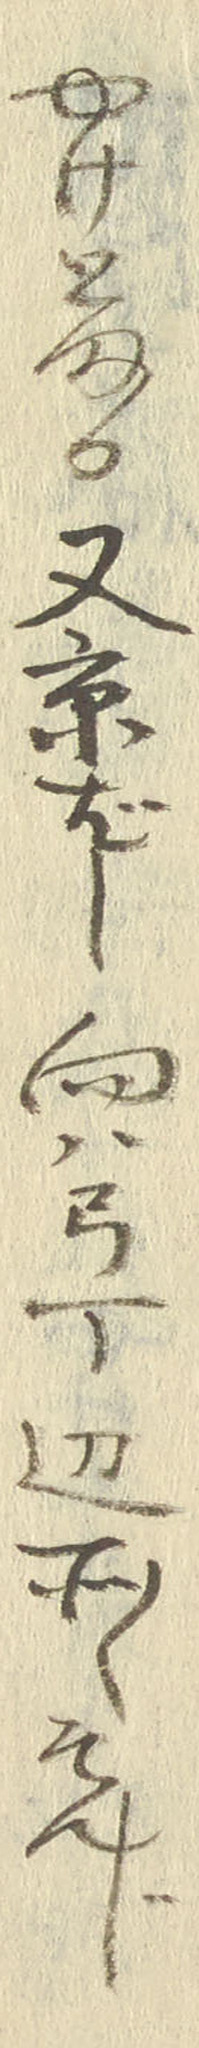やけとまる又京ばし向ハ弓丁辺所〳〵そんじ
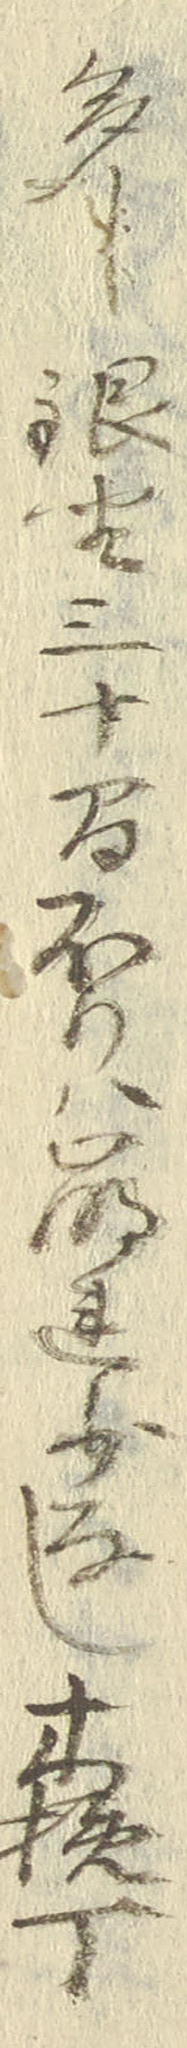多し銀坐三十間ほりハ崩れ少なし木挽丁
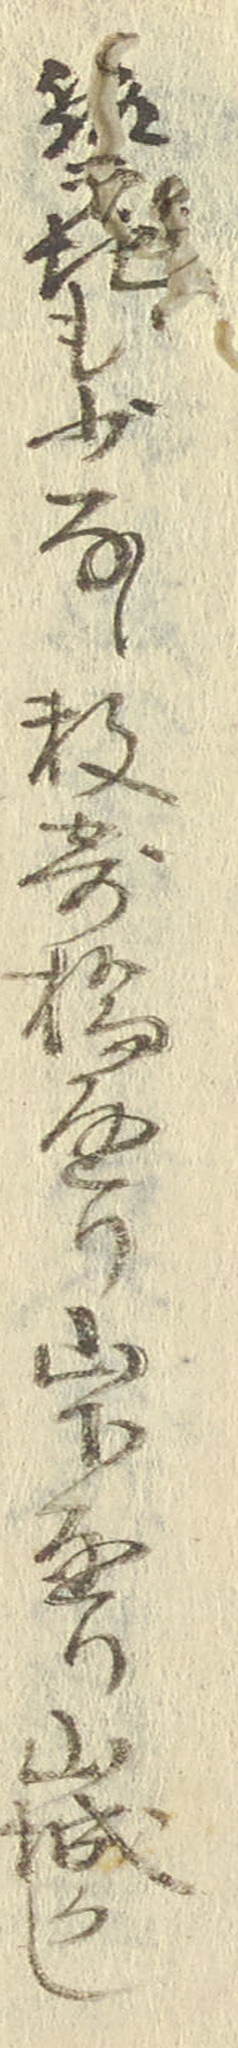築地も少なし数寄橋通り山下通り山城かし
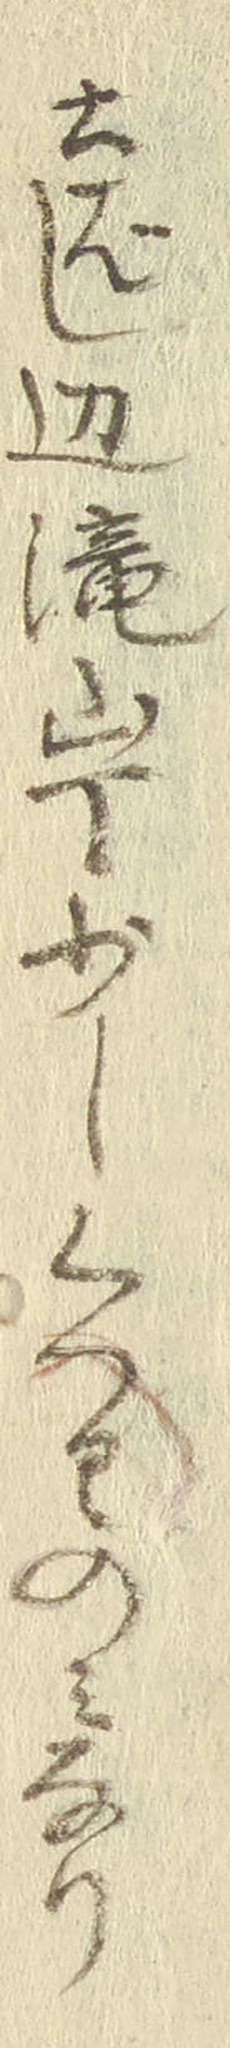土ばし辺滝山丁少しくつるゝのミなり
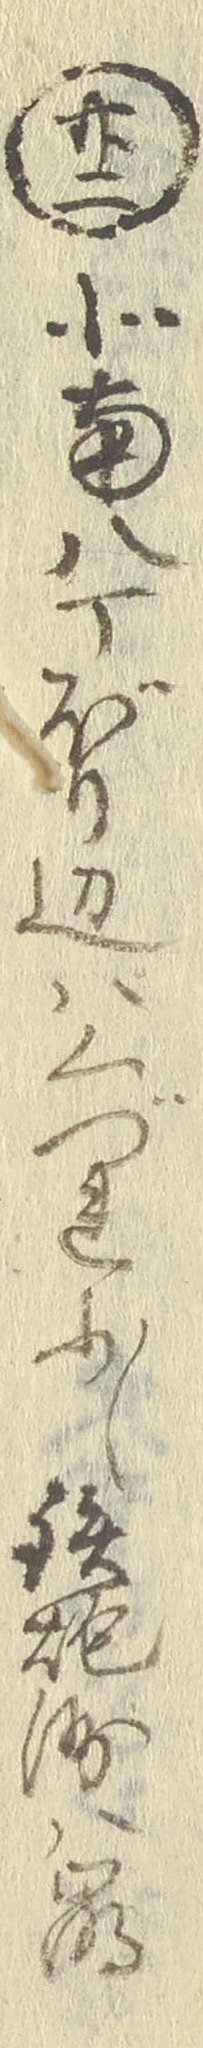廿二北南八丁ぼり辺ハくづれ少し鉄炮洲ハ崩
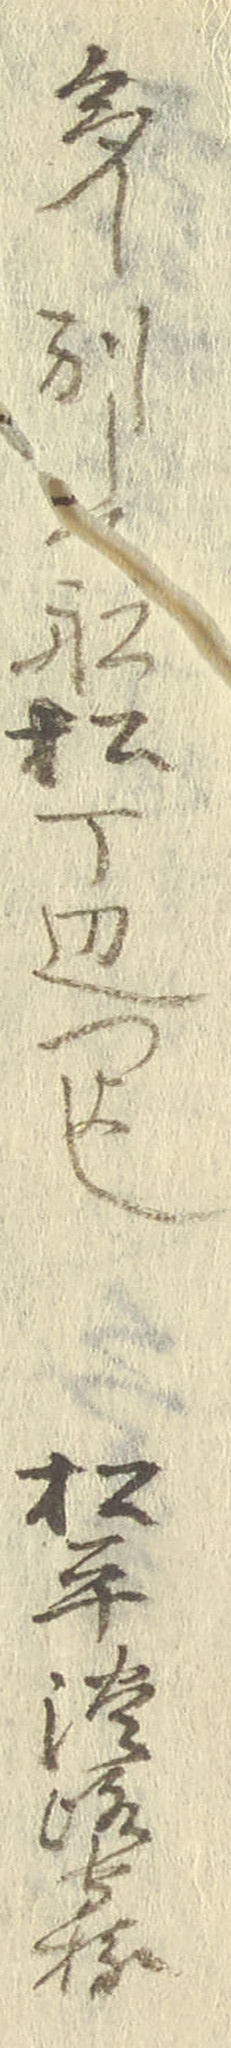多し別して船松丁辺つよし松平淡路守様
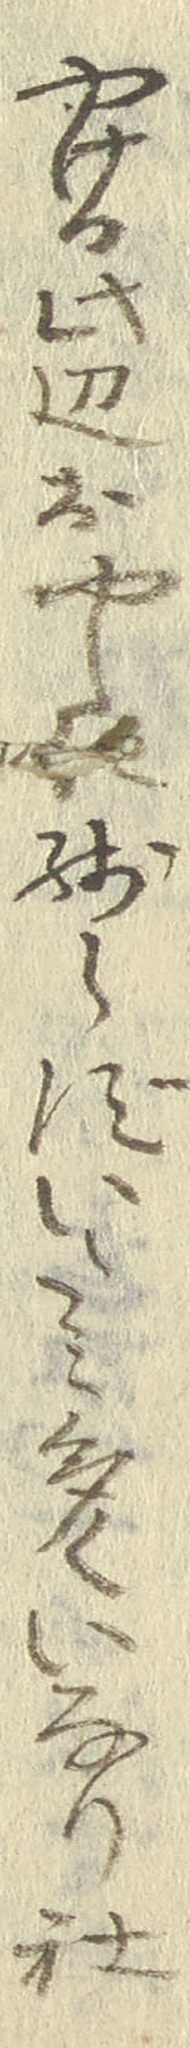やける此辺おやき残らずいたミ多くいなり社
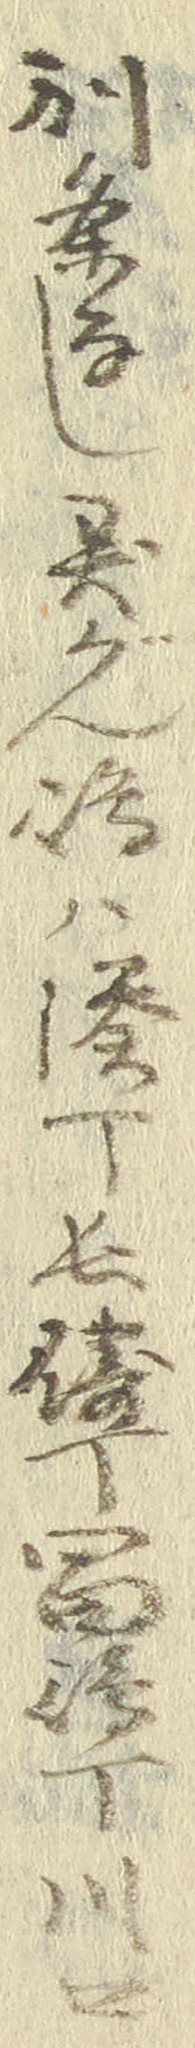別条なし霊がん嶋ハ湊丁長俦丁富嶋丁川口
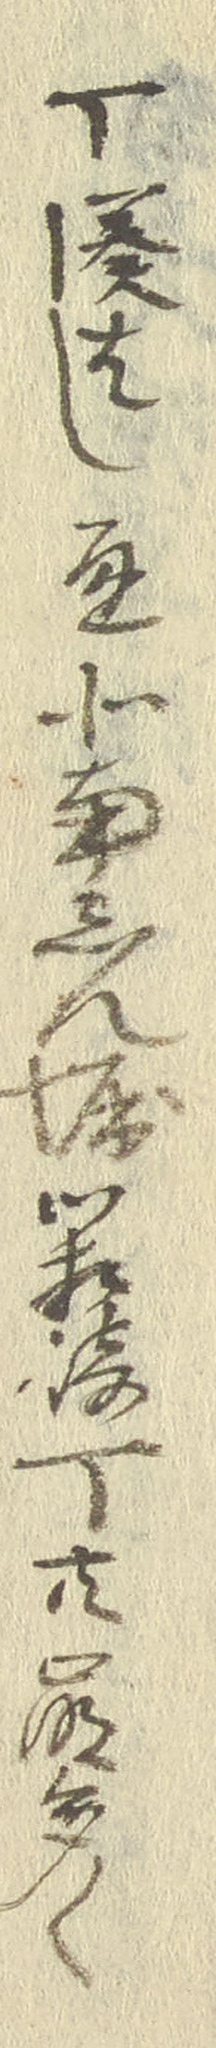丁湊はし通北南しん堀箱崎丁共崩多く

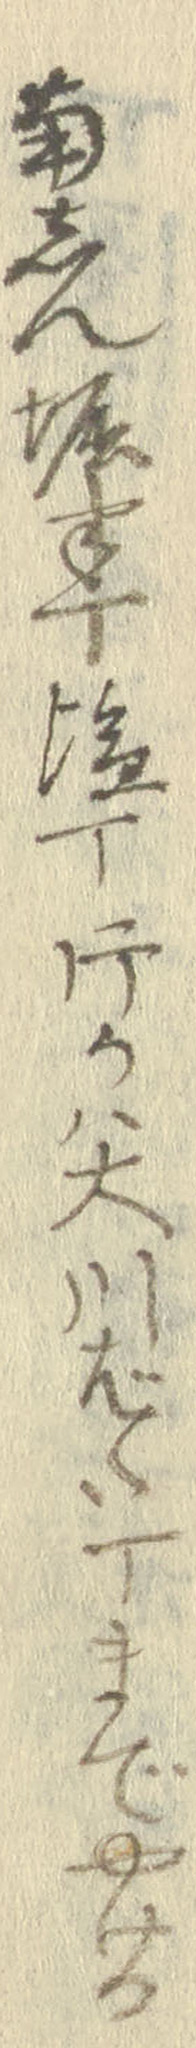南しん堀半丁塩丁片かハ大河ばた丁までやける
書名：御府内御屋敷方市中共地震類焼場所明細書之冩兼街道筋近郷聞書
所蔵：東京大学総合図書館 General Library in the University of Tokyo, JAPAN
